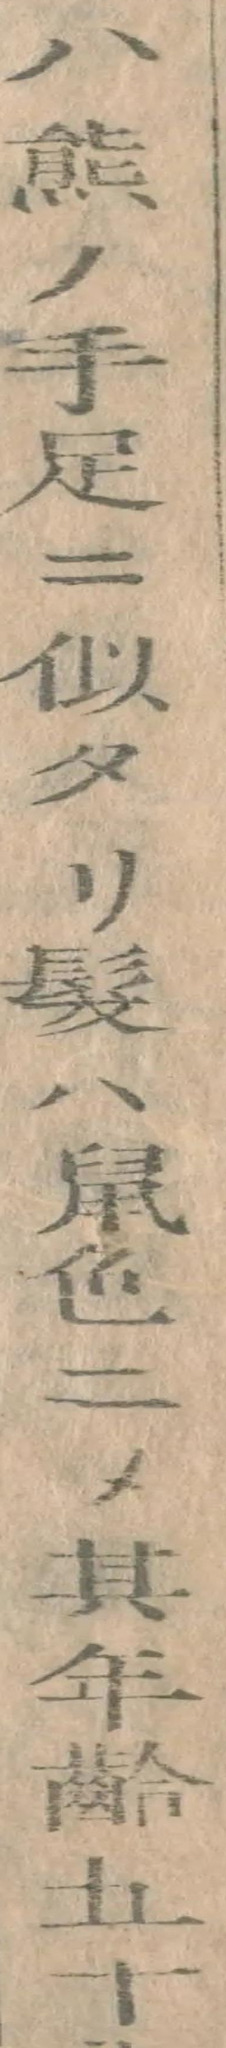ハ熊ノ手足ニ似タリ髪ハ鼠色ニシテ其年齢五十
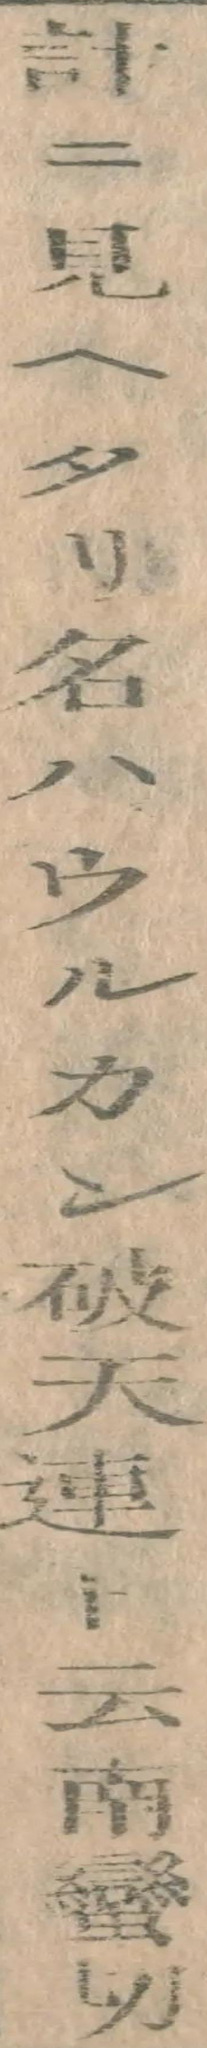計ニ見ヘタリ名ハウルカン破天連ト云南蛮切
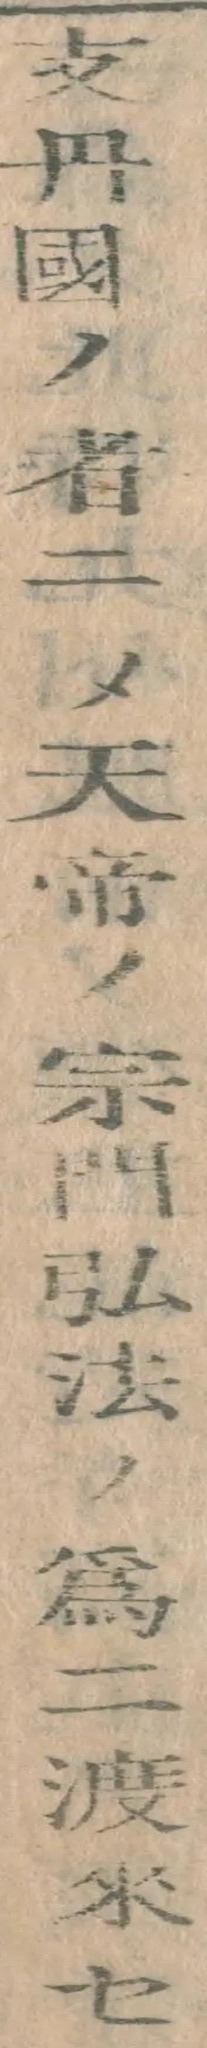支丹国ノ者ニシテ天帝ノ宗門弘法ノ為ニ渡来セ
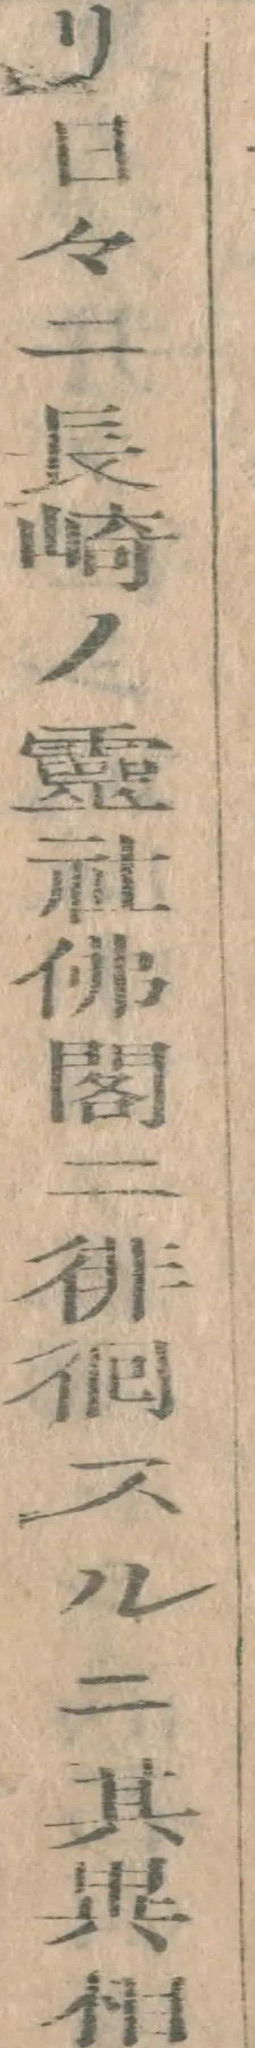リ日々ニ長崎ノ霊社仏閣ニ徘徊スルニ其異相
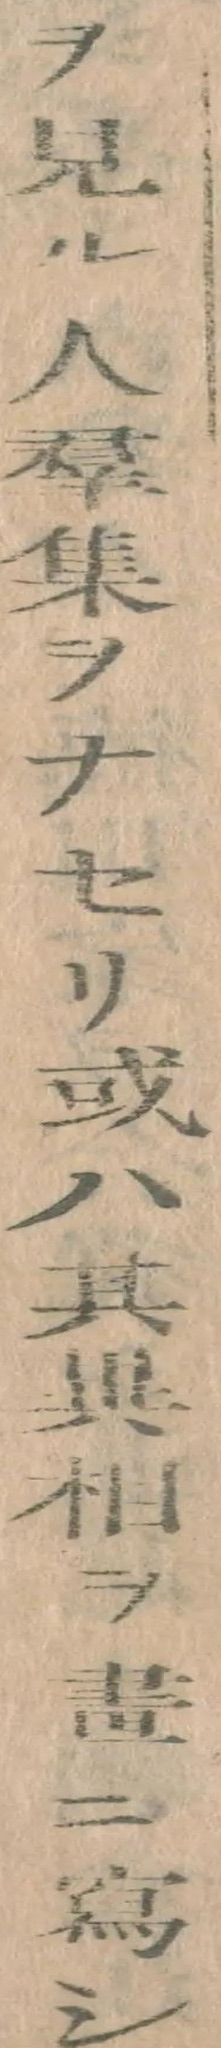ヲ見ル人群集ヲナセリ或ハ其異相ヲ画ニ写シ
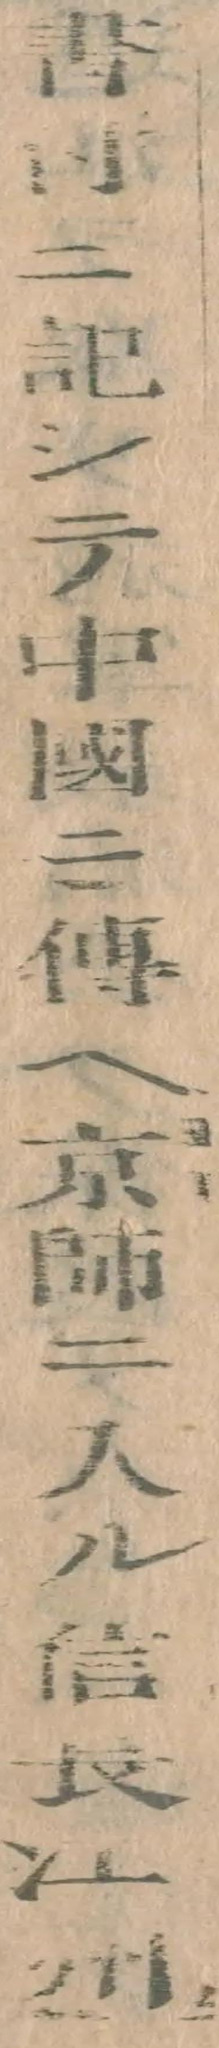書付ニ記シテ中国ニ伝ヘ京師ニ入ル信長江州
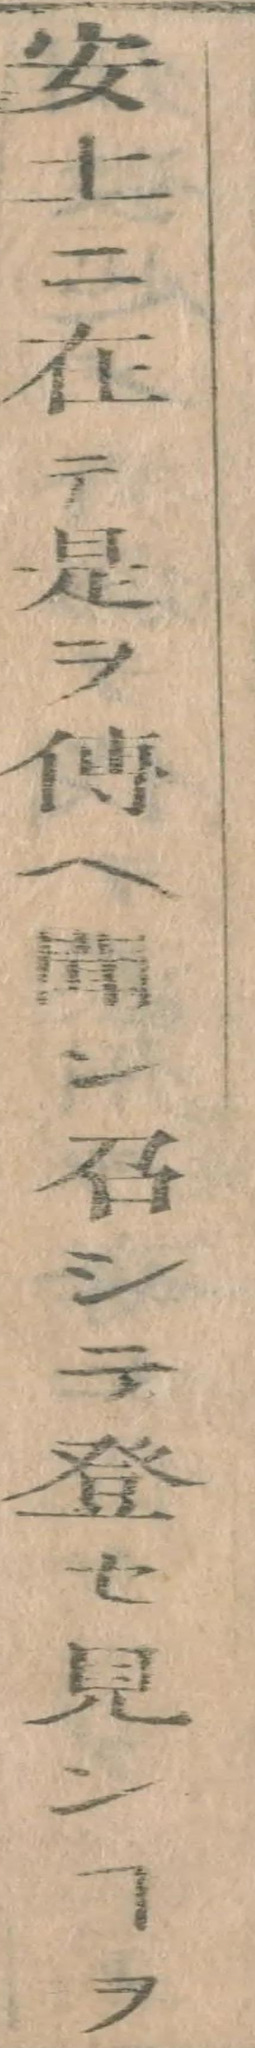安土ニ在テ是ヲ伝へ聞ン召シテ登セ見ンヿヲ
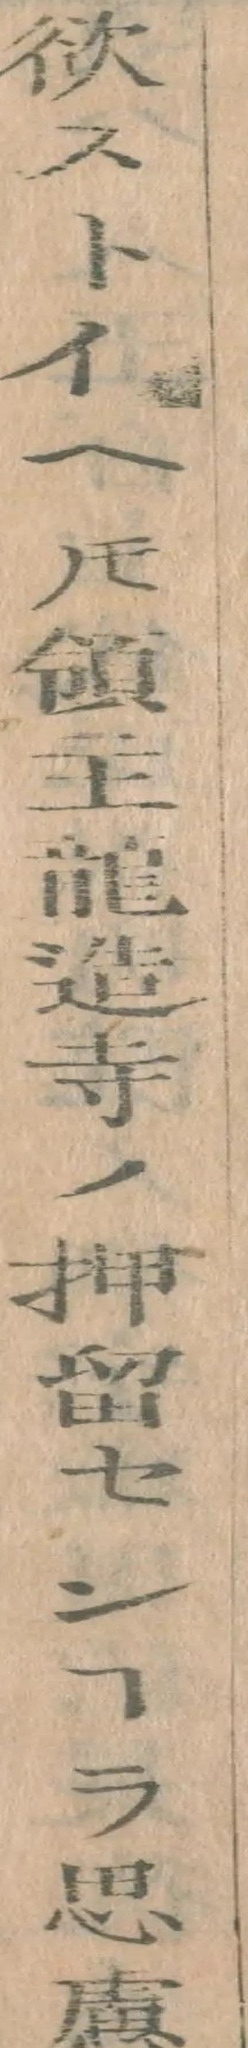欲ストイヘトモ領主竜造寺ノ押留センヿヲ思慮
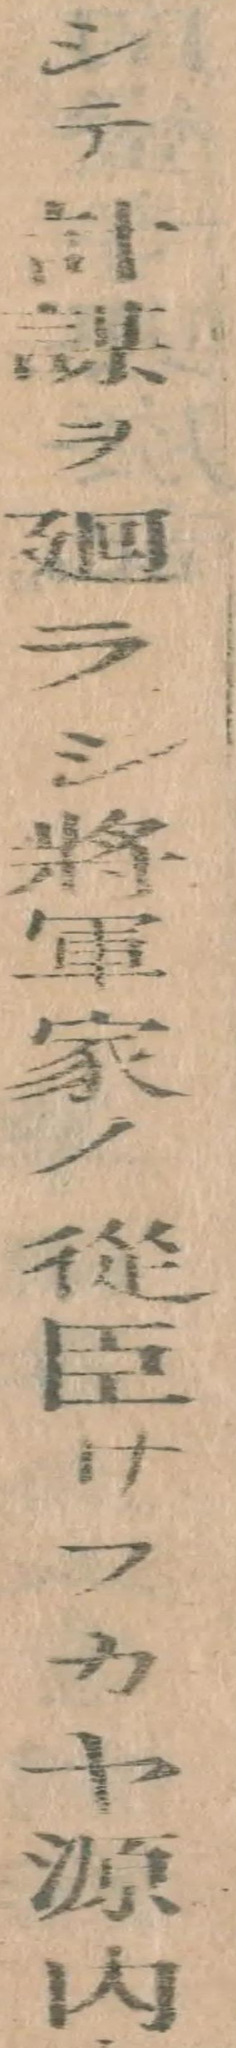シテ計謀ヲ廻ラシ将軍家ノ従臣サフカヤ源内
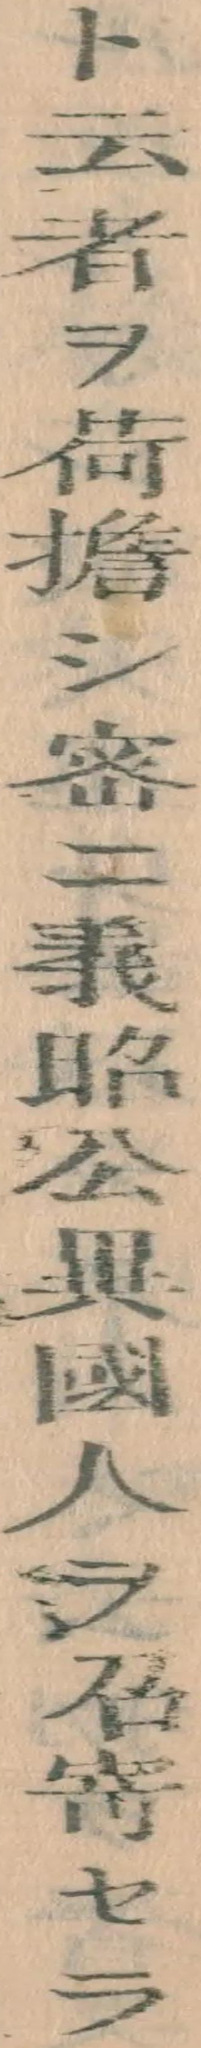ト云者ヲ荷担シ密ニ義昭公異国人ヲ召寄セラ
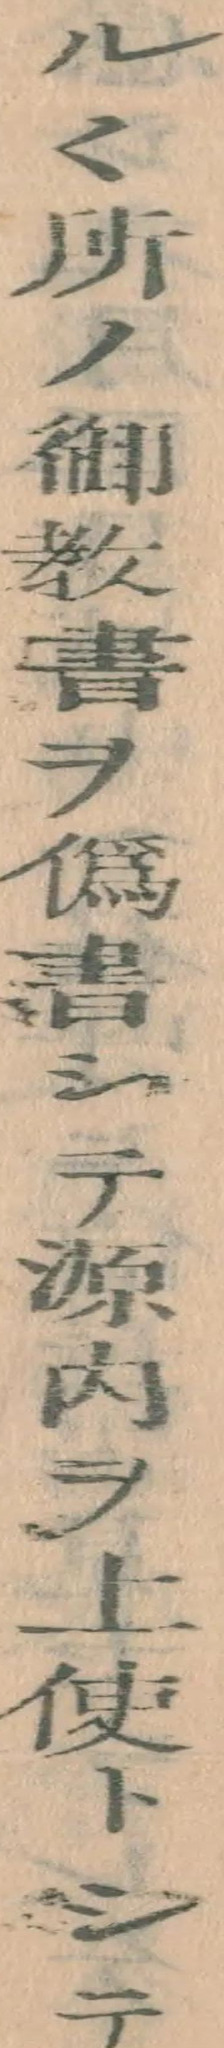ル〱所ノ御教書ヲ偽書シテ源内ヲ上使トシテ
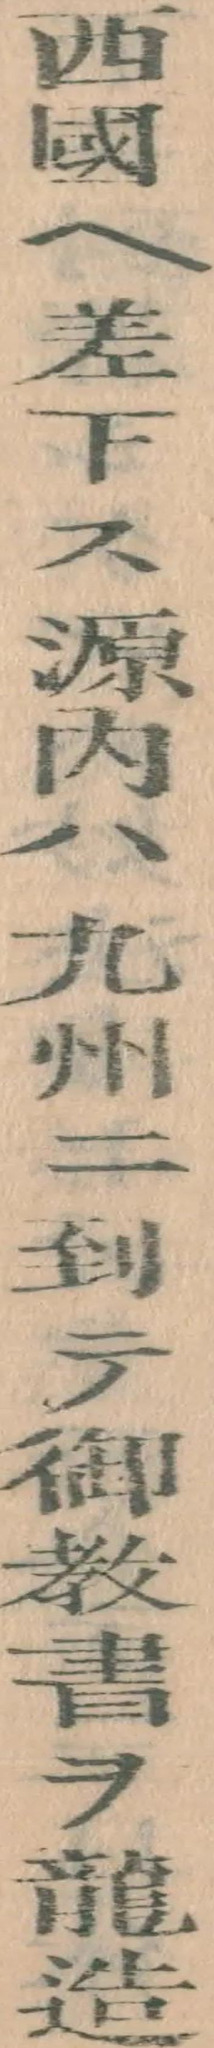西国ヘ差下ス源内ハ九州ニ到テ御教書ヲ竜造
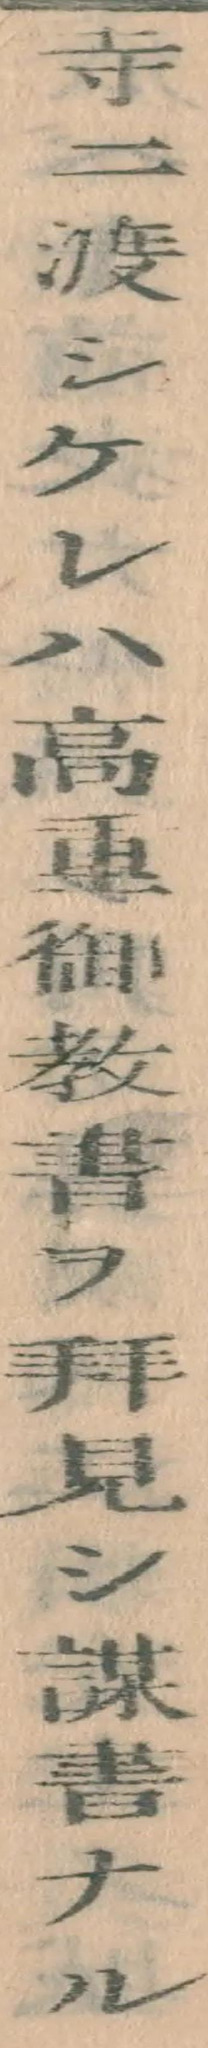寺ニ渡シケレハ高重御教書ヲ拝見シ謀書ナル
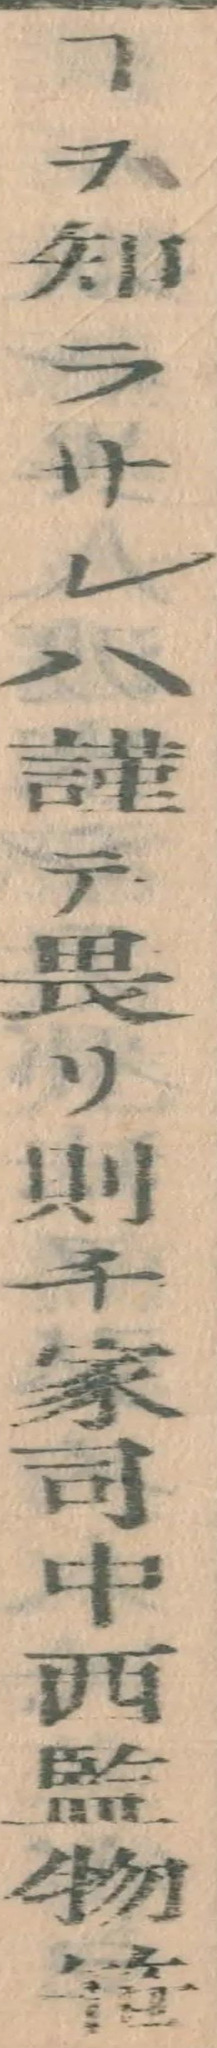ヿヲ知ラサレハ謹テ畏リ則千家司中西監物笹
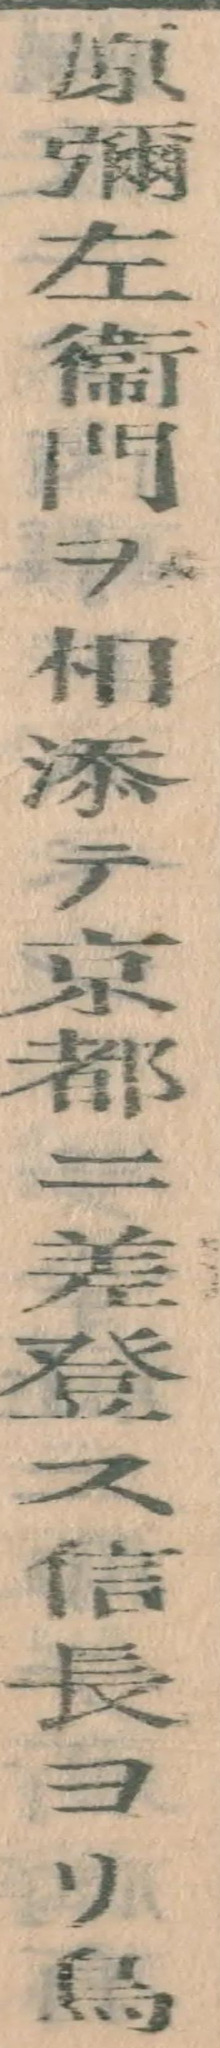原弥左衛門ヲ相添テ京都ニ差登ス信長ヨリ鳥
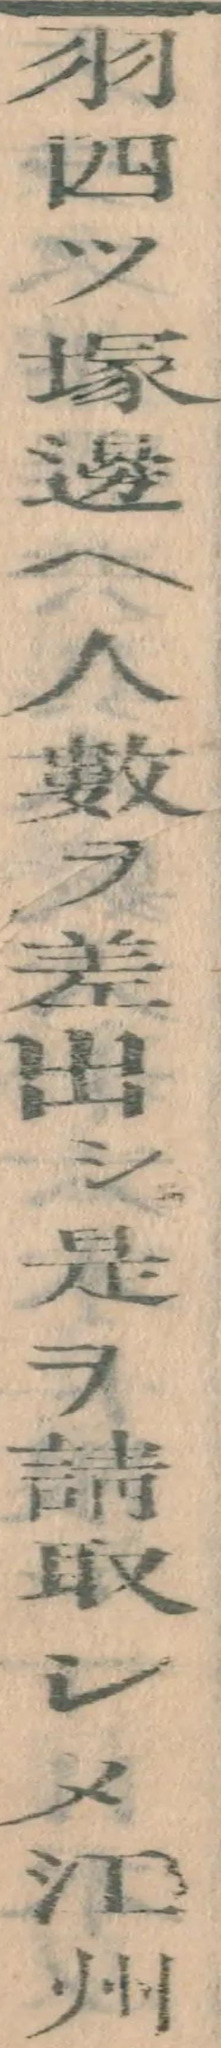羽四ツ塚辺へ人数ヲ差出シ是ヲ請取シメ江州
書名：南蛮寺興廃記
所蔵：国立国会図書館 National Diet Library, JAPAN
